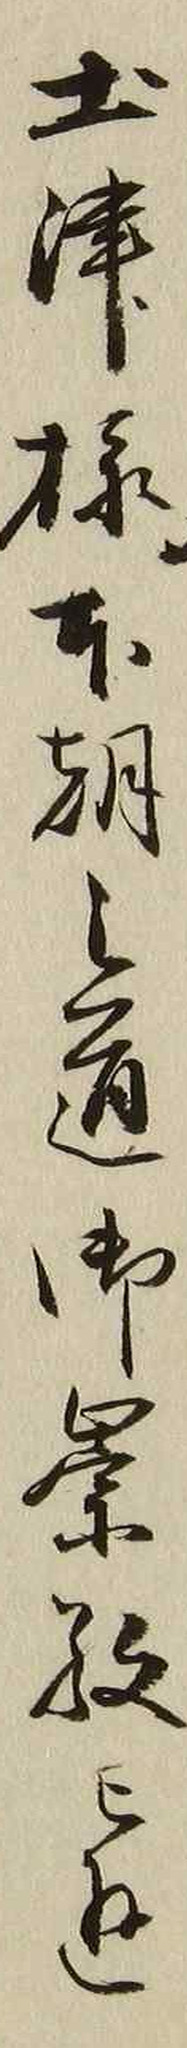土津様本朝之道御崇敬被遊
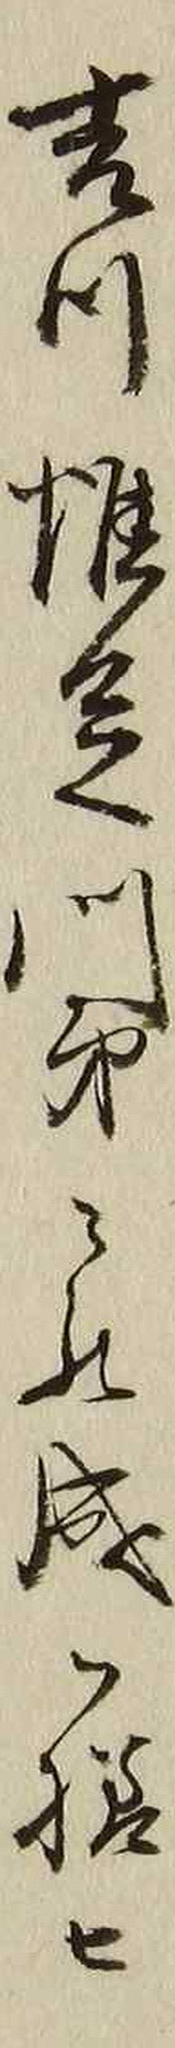吉川惟足門弟ニ罷成候様被
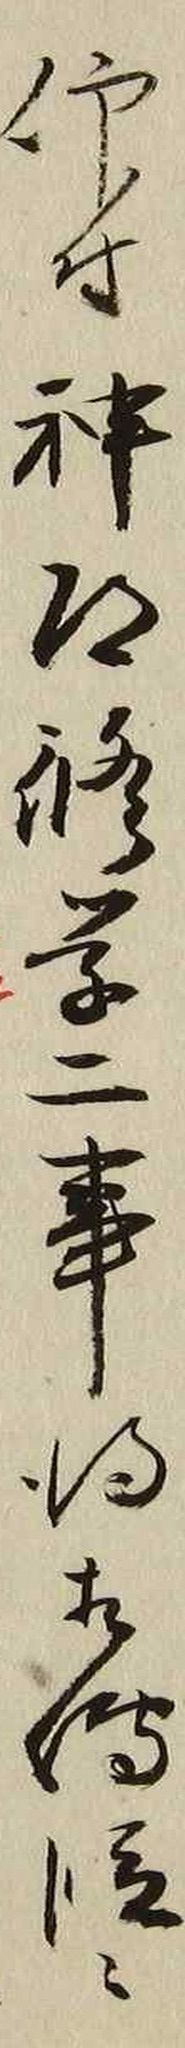仰付神道修学二事得相伝段々
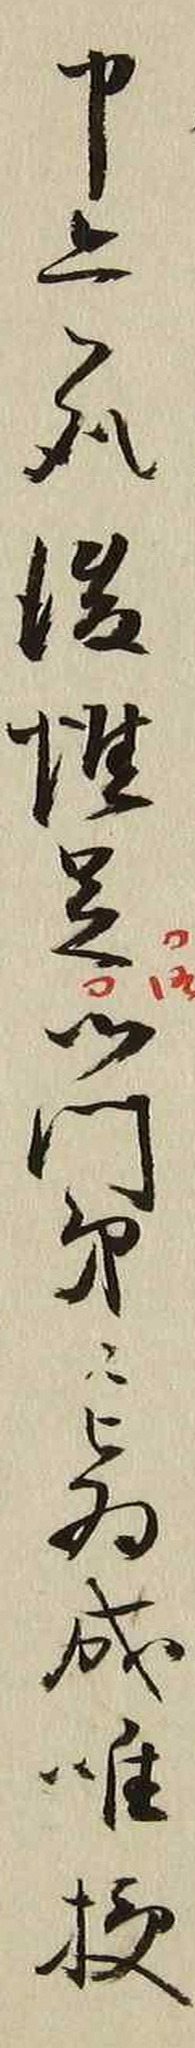申上候処後惟足御門弟ニ被為成唯授
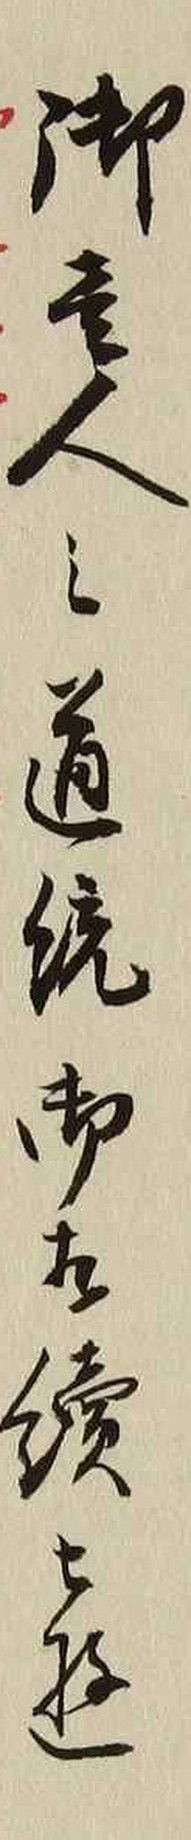御壱人之道統御相続被遊
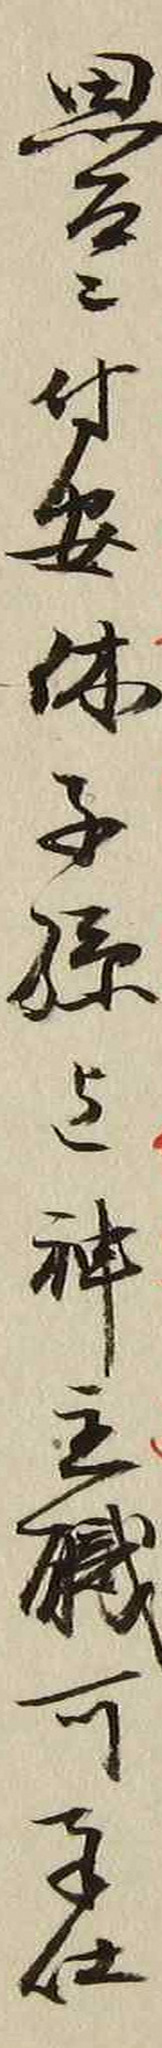思召ニ付安休子孫迄神主職可奉仕
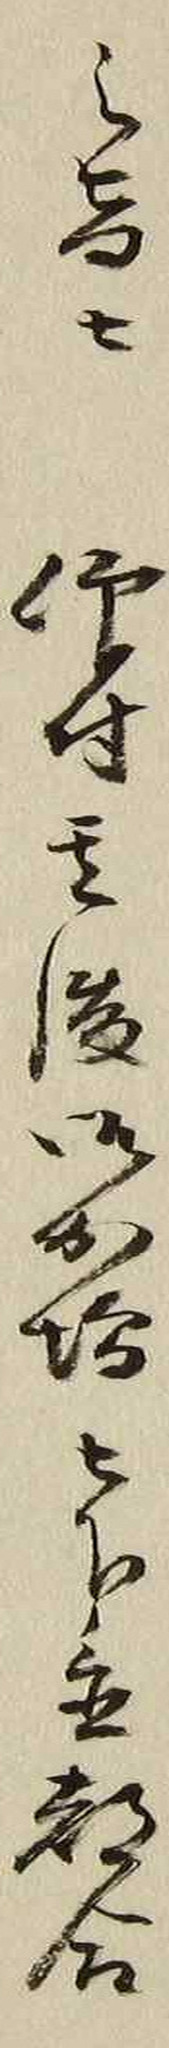之旨被仰付其後御加増被下置都合
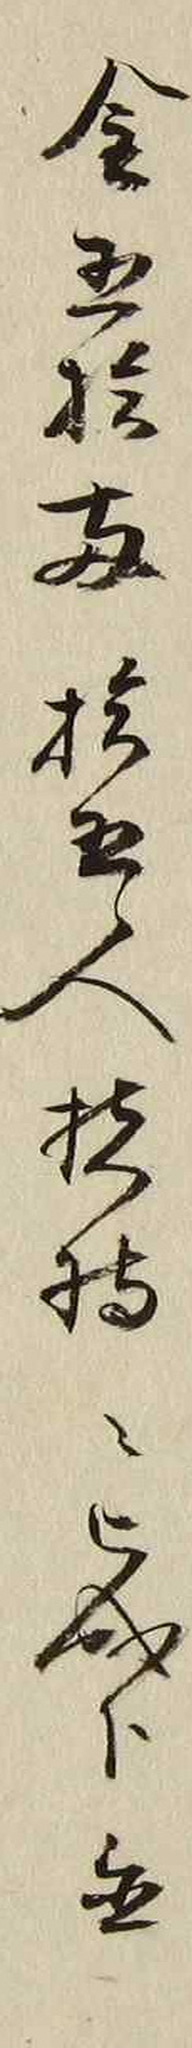金五拾両拾五人扶持ニ被成下置候
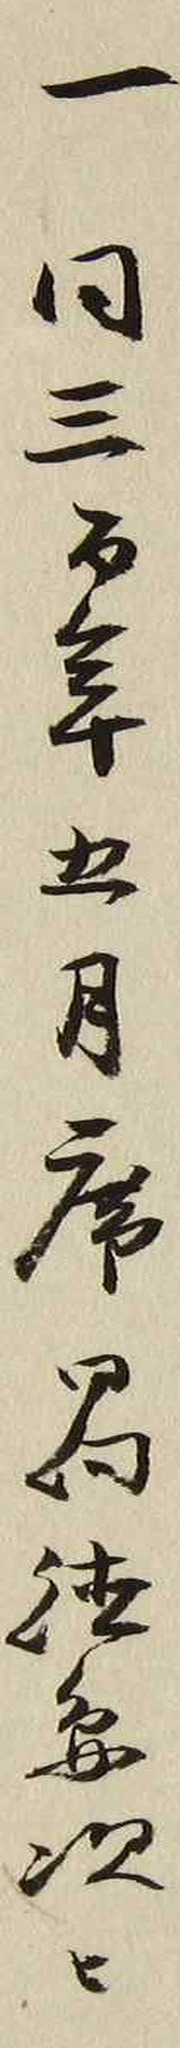一同三酉年五月席日向徳円次被
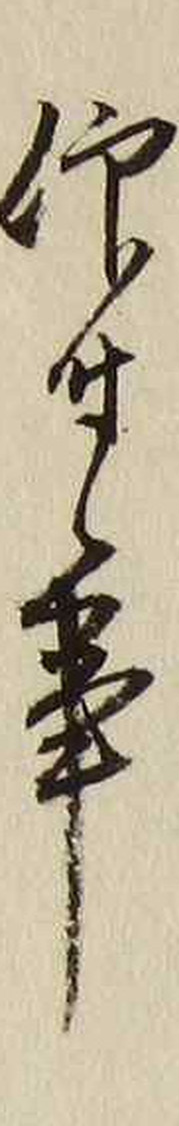仰付候事
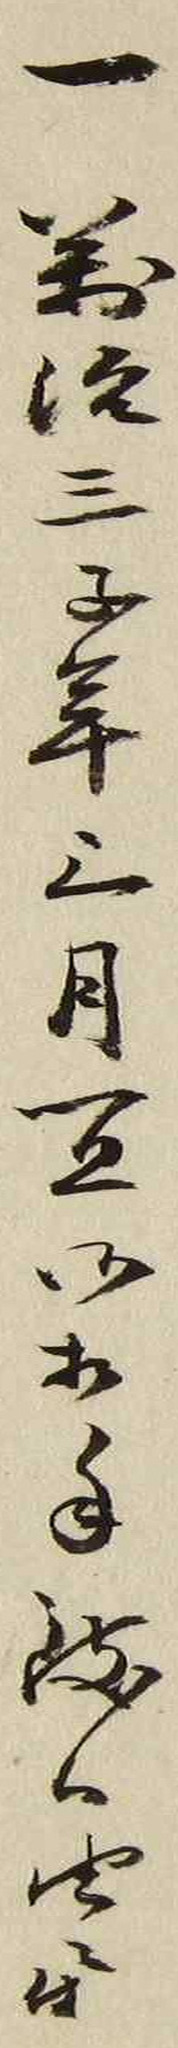一万治三子年三月宜御相手致候由ニ付
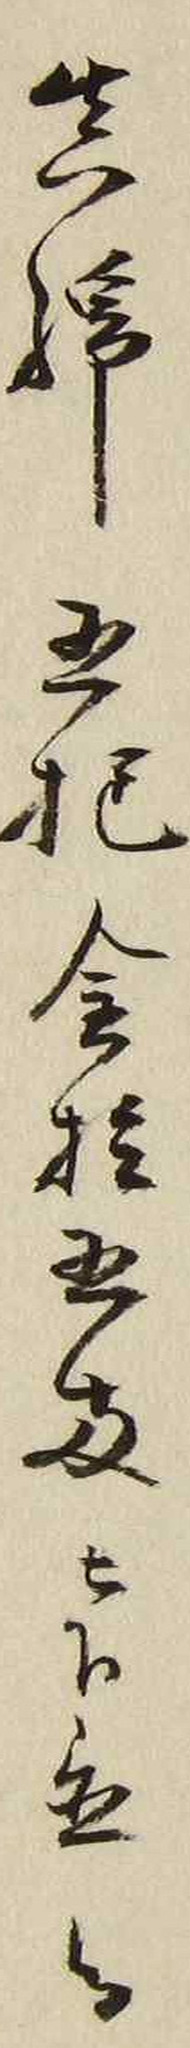真綿五把金拾五両被下置候

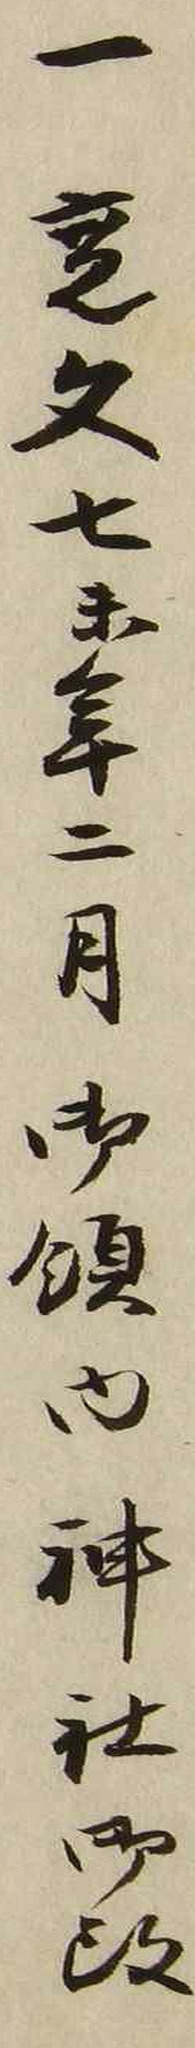一寛文七未年二月御領内神社御改
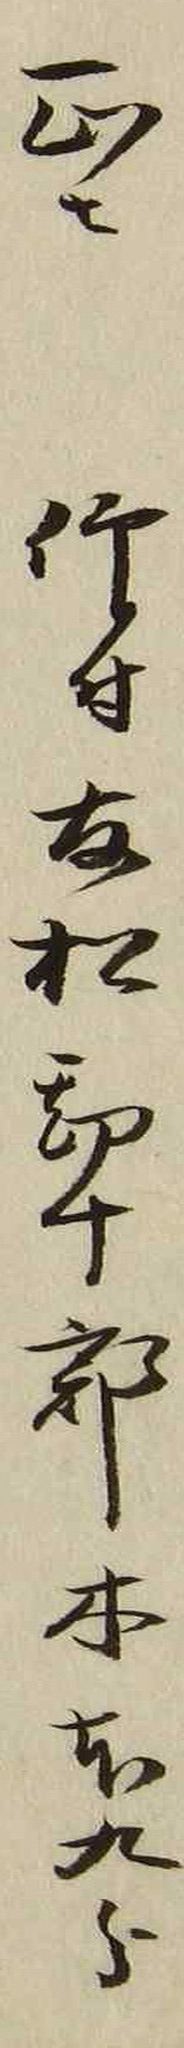正被仰付友松勘十郎木本九郎
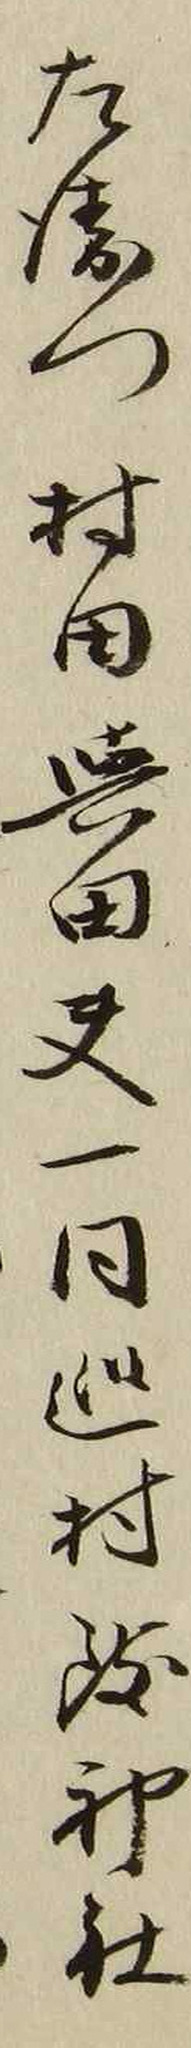左衛門村田与田夫一同巡村致神社
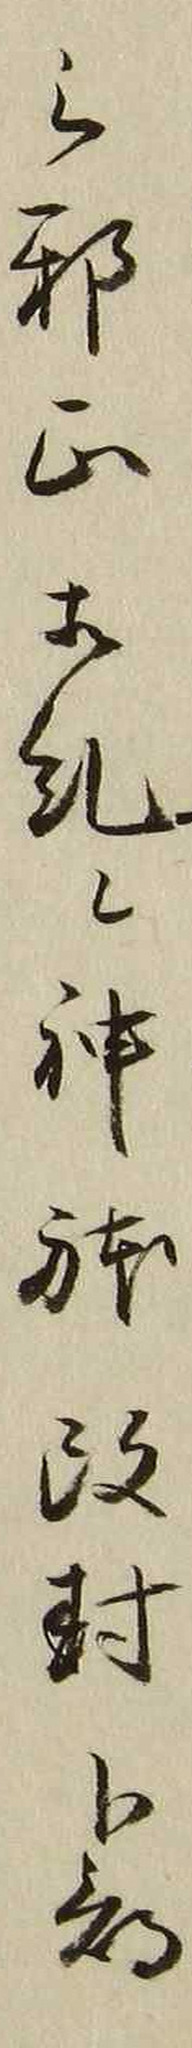之邪正相糺シ神体改封卜部
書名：諸士系譜　巻之291　さ之部23
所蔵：会津若松市立会津図書館
